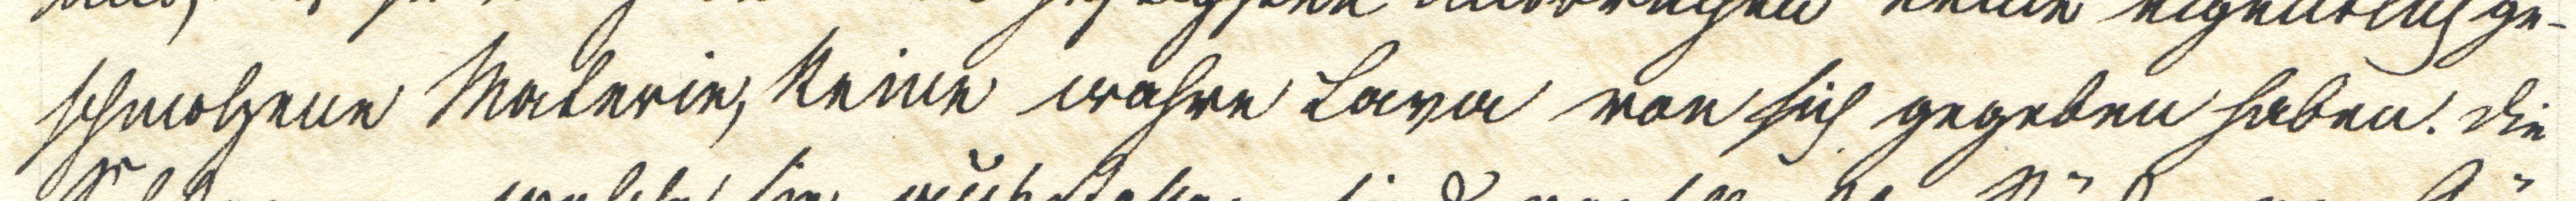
schmolzene Materie, keine wahre Lava von sich gegeben haben. Die
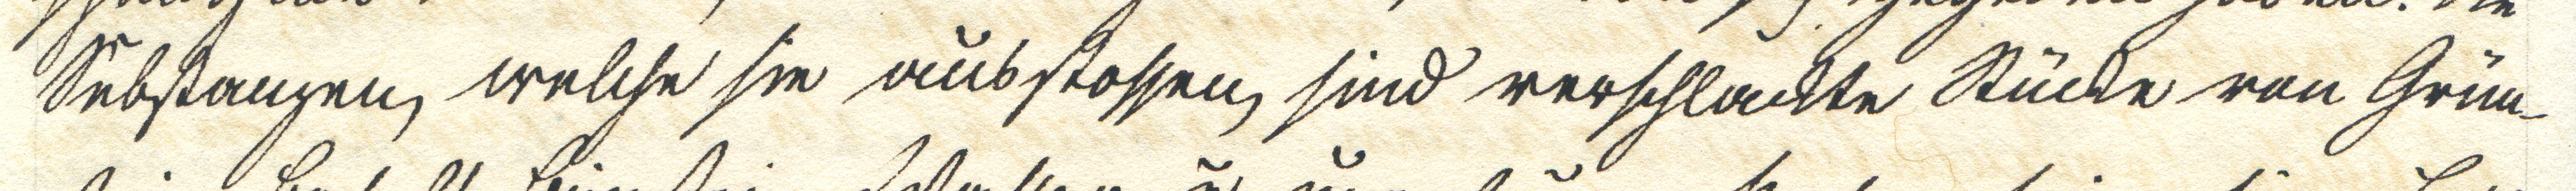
Substanzen, welche sie ausstossen, sind verschluckte Stücke Grün-
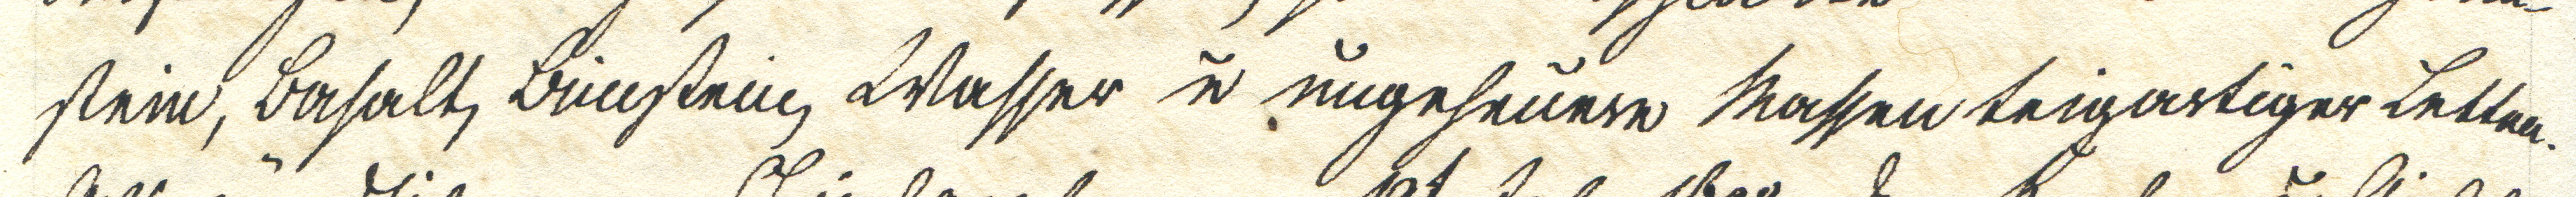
stein, Basalt, Bimstein, Wasser u ungeheure Massen teigartiger Letten.
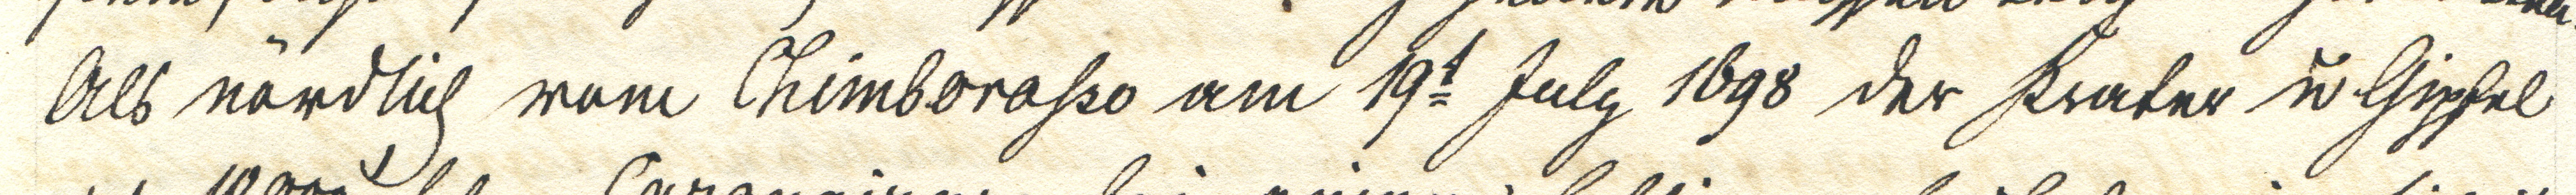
Als nördlich vom Chimborasso am 19t July 1698 der Krater u Gipfel
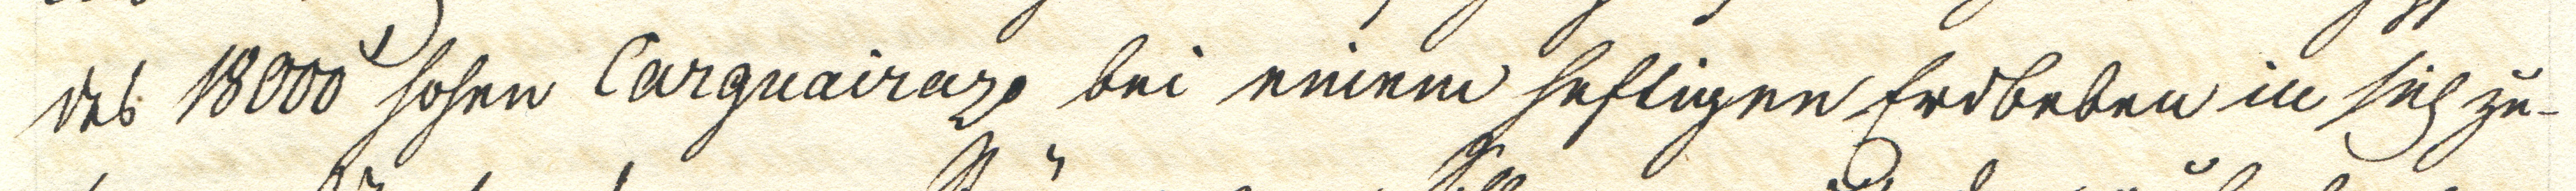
des 18000′ hohen Carguairazo bei einem heftigen Erdbeben in sich zu-
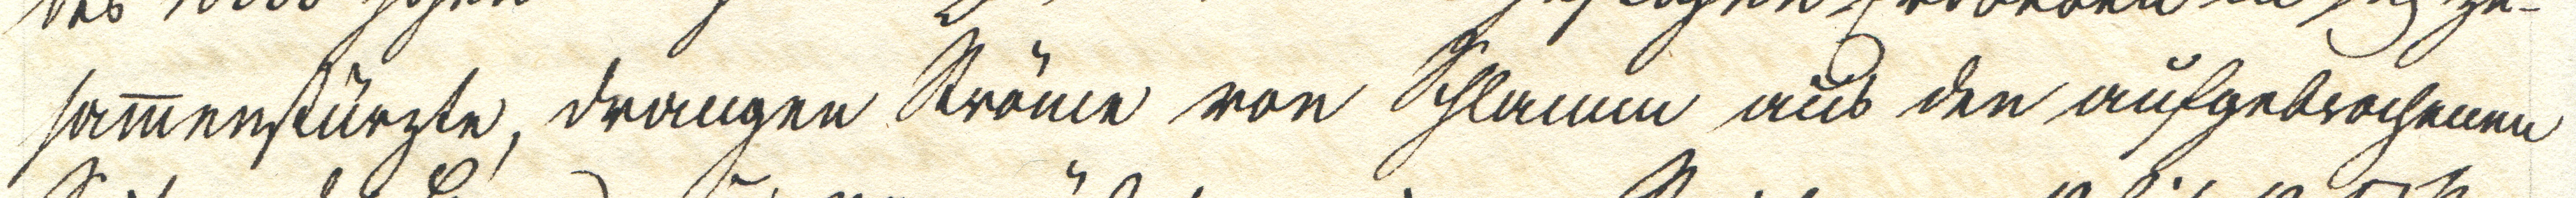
sam̃enstürzte, drangen Ströme von Schlamm aus den aufgebrochenen
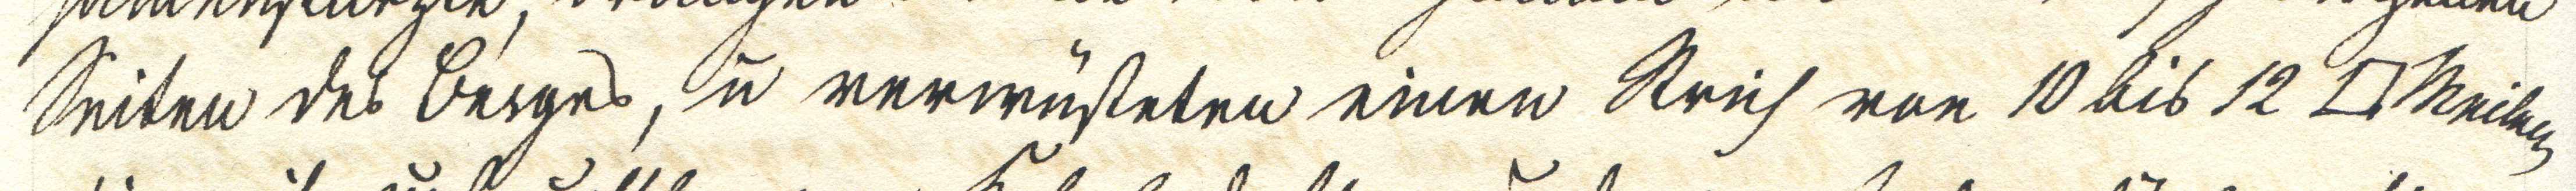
Seiten des Berges, u verwüsteten einen Strich von 10 bis 12 □ Meilen,
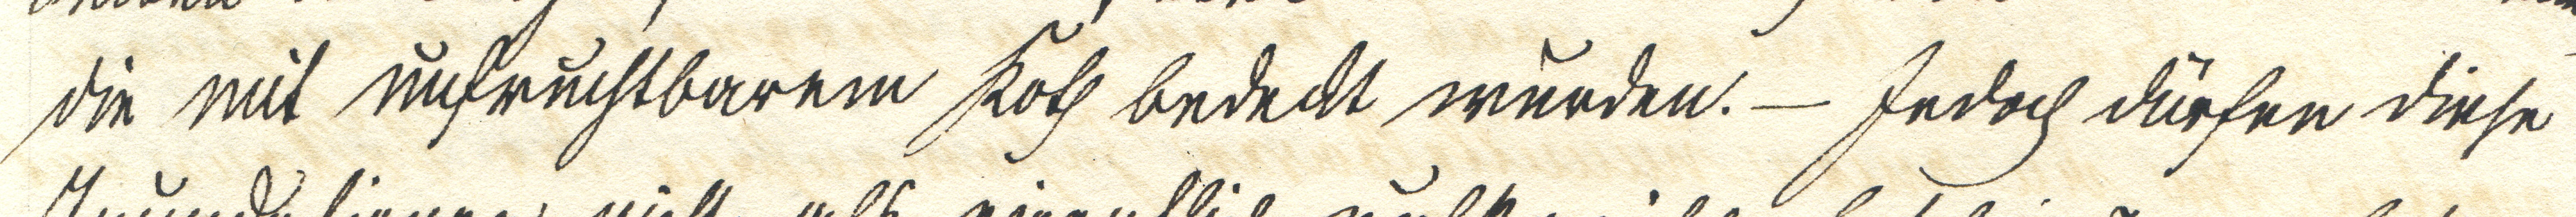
die mit unfruchtbarem Koth bedeckt wurden. – Jedoch dürfen diese
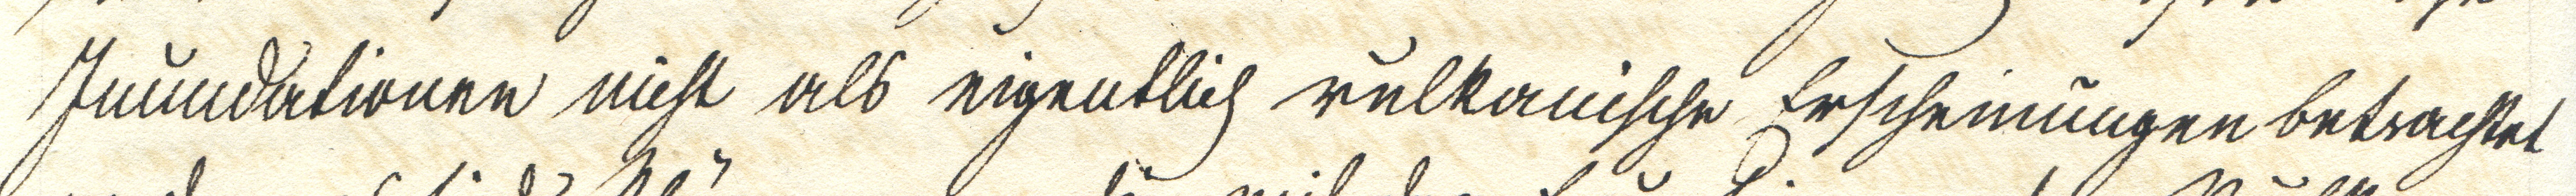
Inundationen nicht als eigentlich vulkanische Erscheinungen betrachtet
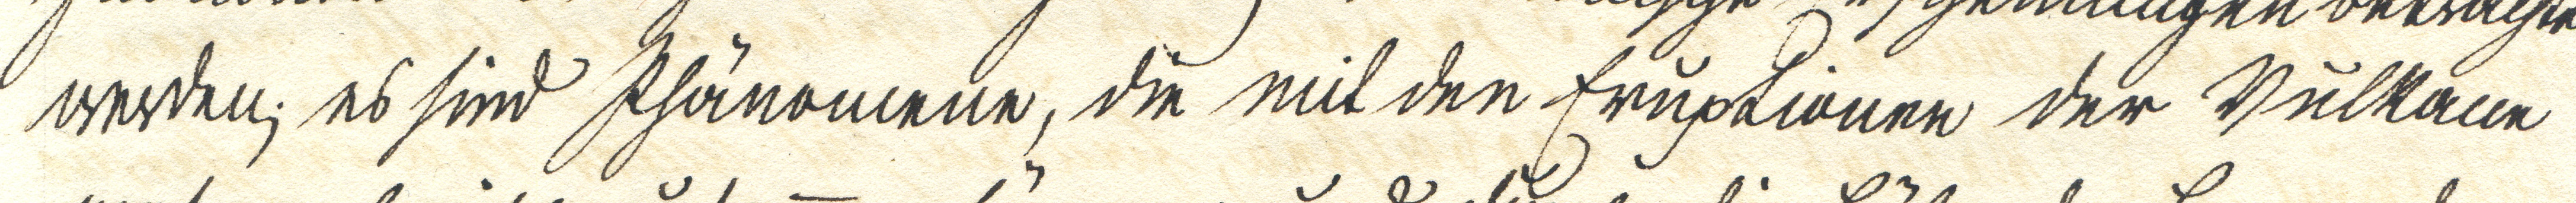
werden; es sind Phänomene, die mit den Eruptionen der Vulkane
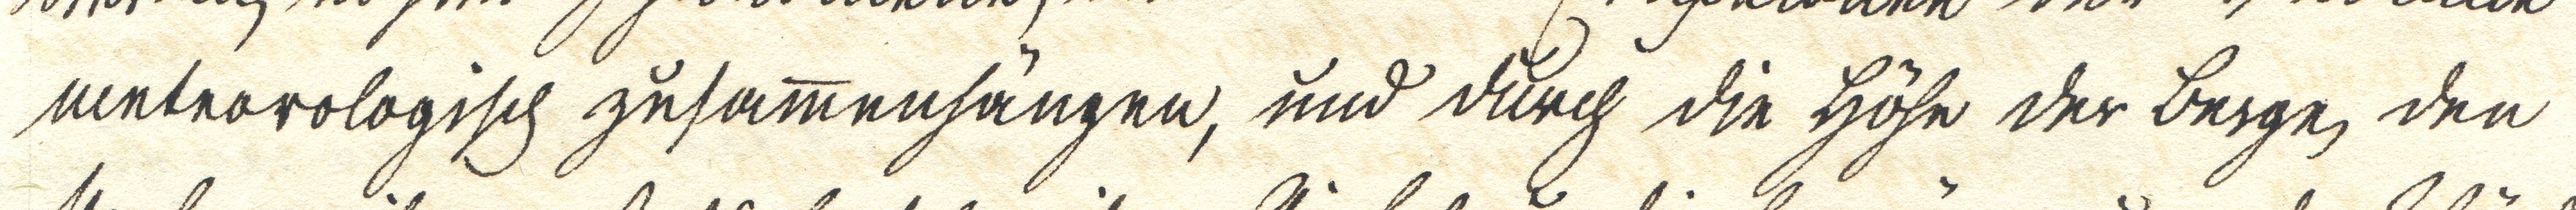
meteorologisch zusam̃enhängen, und durch die Höhe der Berge, den
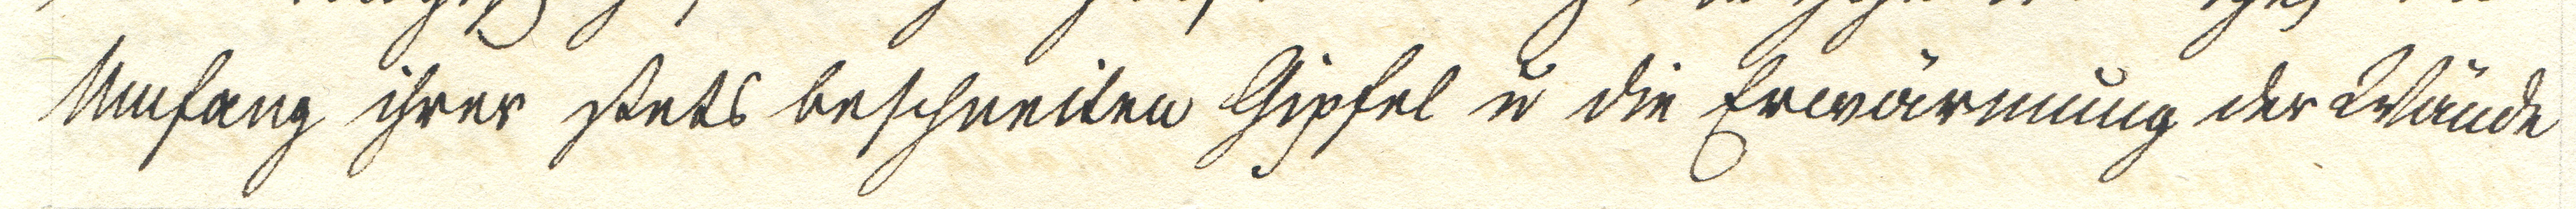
Umfang ihrer stets beschneiten Gipfel u die Erwärmung der Wände
